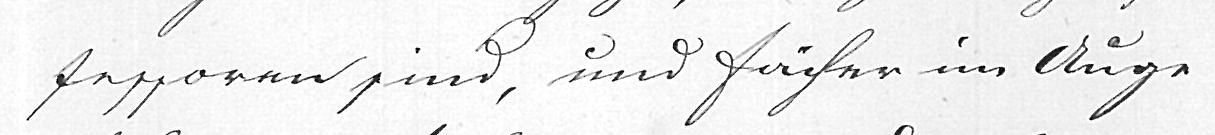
fessoren sind, und Fächer im Auge
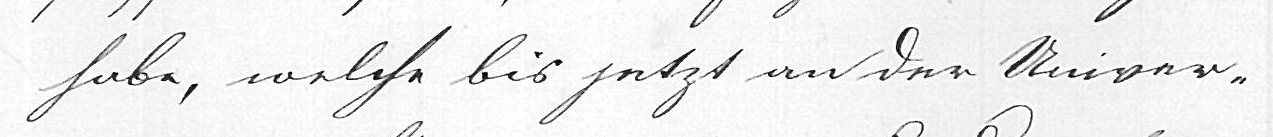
habe, welche bis jetzt an der Univer-
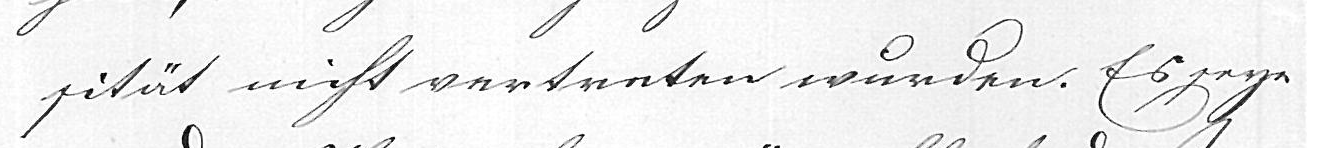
sität nicht vertreten wurden. Es seye
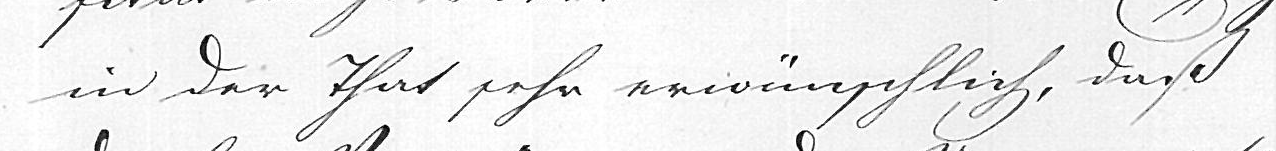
in der That sehr erwünschlich, daß
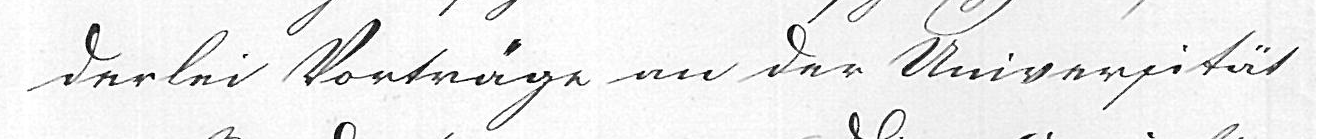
derlei Vorträge an der Universität
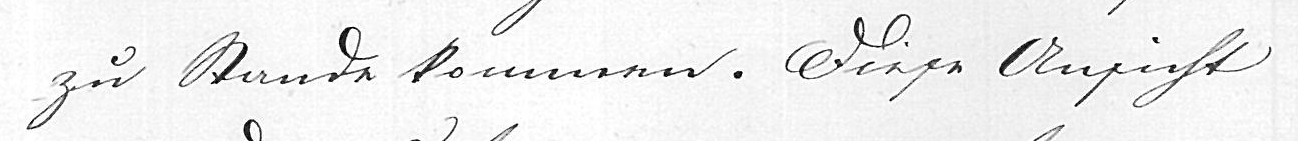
zu Stande kommen. Diese Ansicht
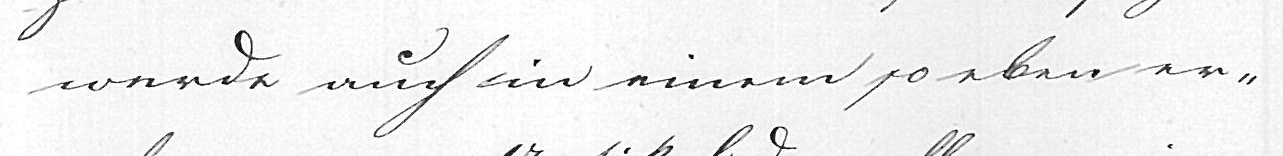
werde auch in einem soeben er-
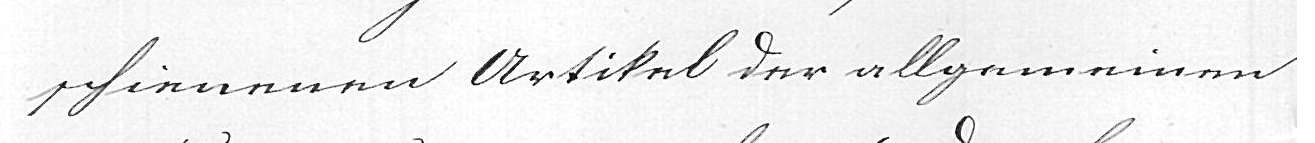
schienenen Artikel der allgemeinen
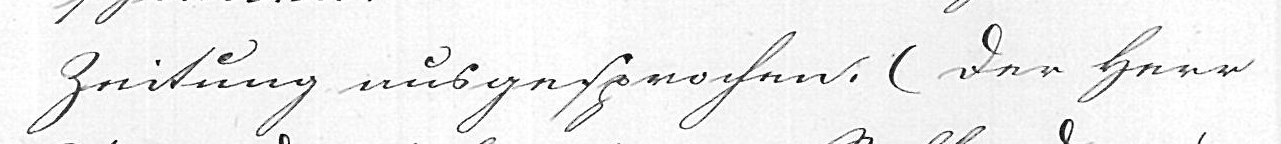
Zeitung ausgesprochen (der Herr
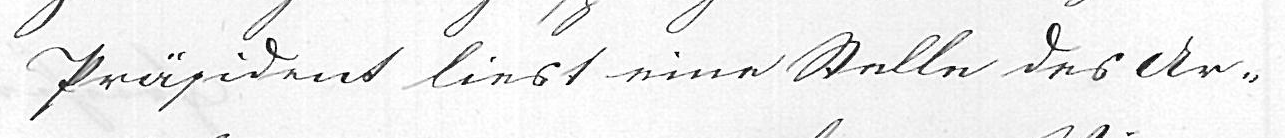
Präsident liest eine Stelle des Ar-
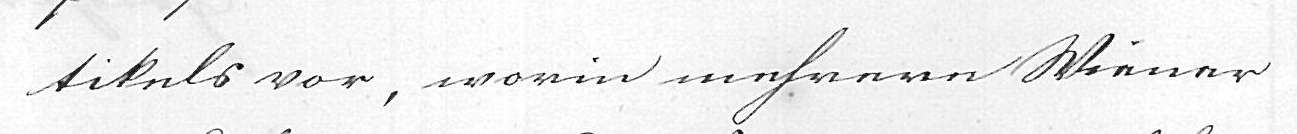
tikels vor, worin mehrere Wiener
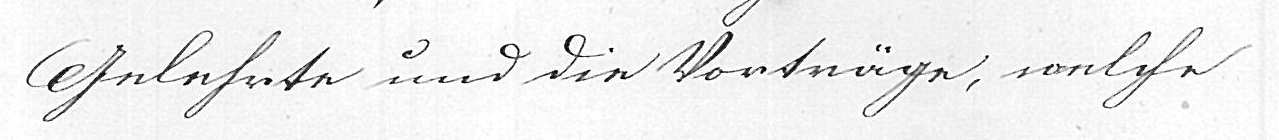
Gelehrte und die Vorträge, welche
